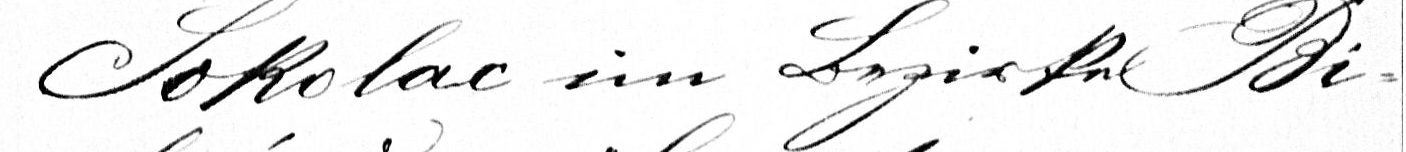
Sokolac im Bezirke Bi¬
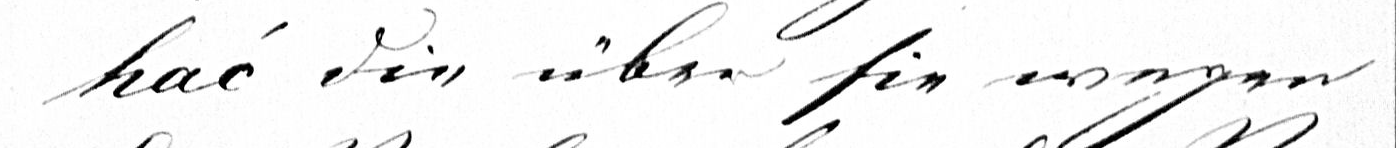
hać die über sie wegen
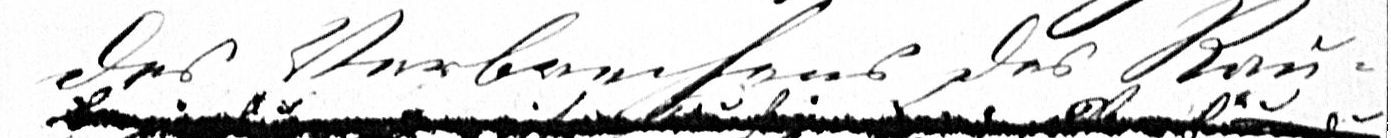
des Verbrechens des Rau¬
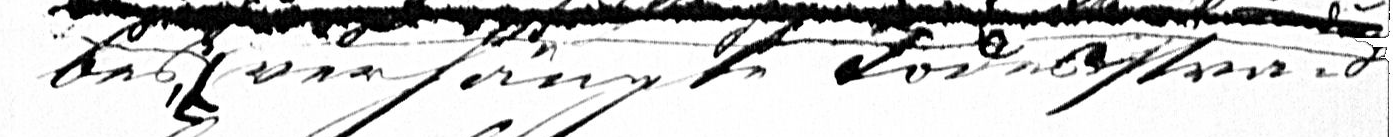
bes, verhängte Todesstra¬
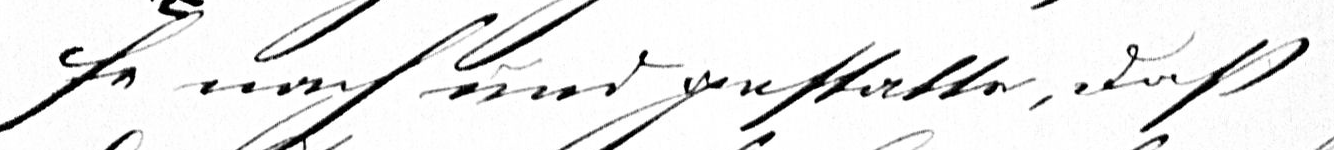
fe nach und gestatte, daß
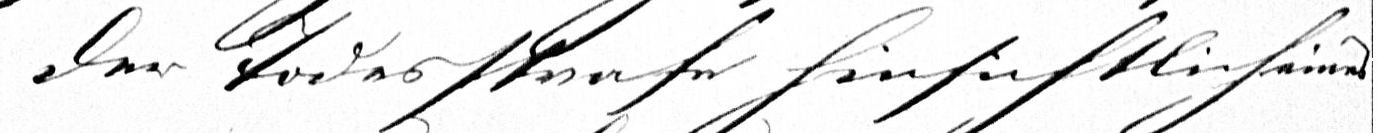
der Todesstrafe hinsichtlich einxx
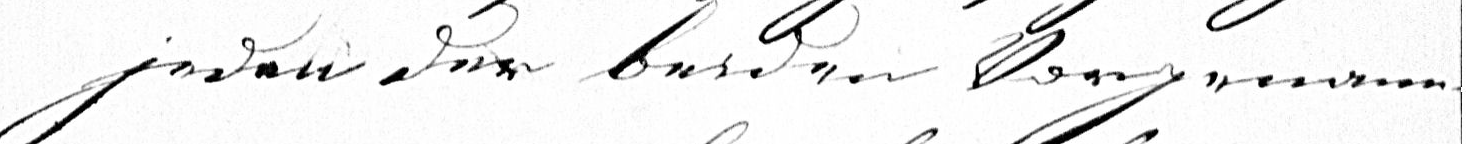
jeden der beiden Vorgenann¬
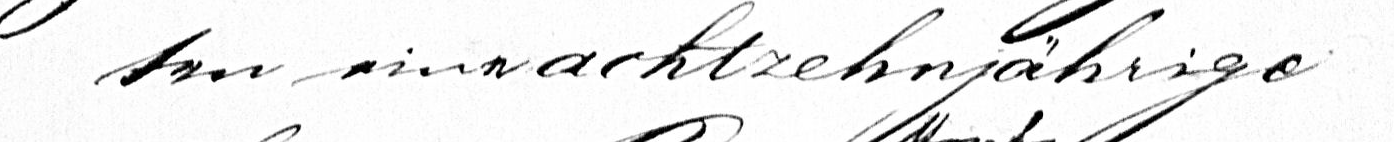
ten einwachtzehnjährige
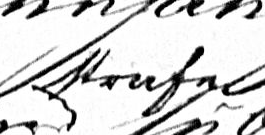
strafe
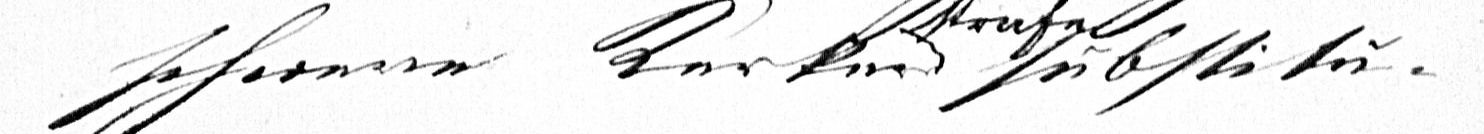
schwere Kerker substitu
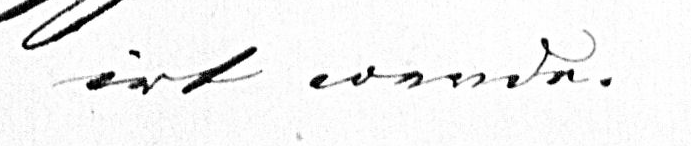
irt werde.
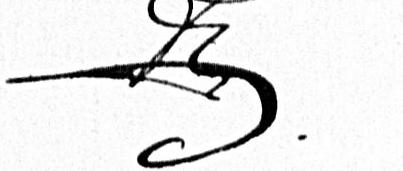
xx
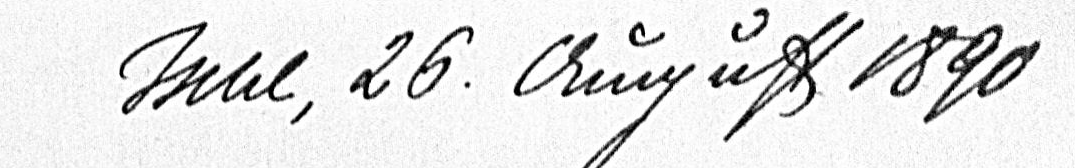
Ischl, 26. August 1890
